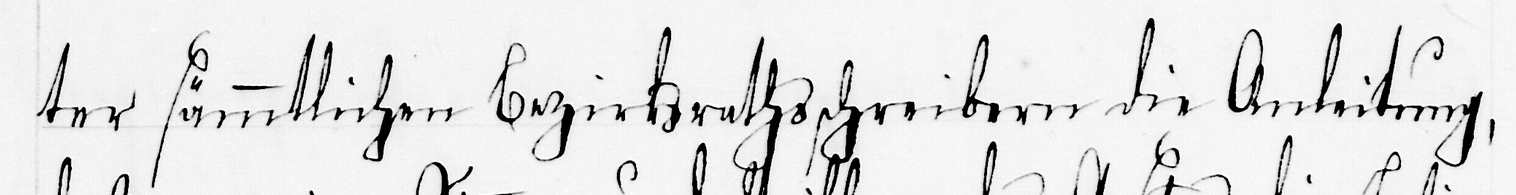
ter sämmtlichen Bezirksrathsschreibern die Anleitung,
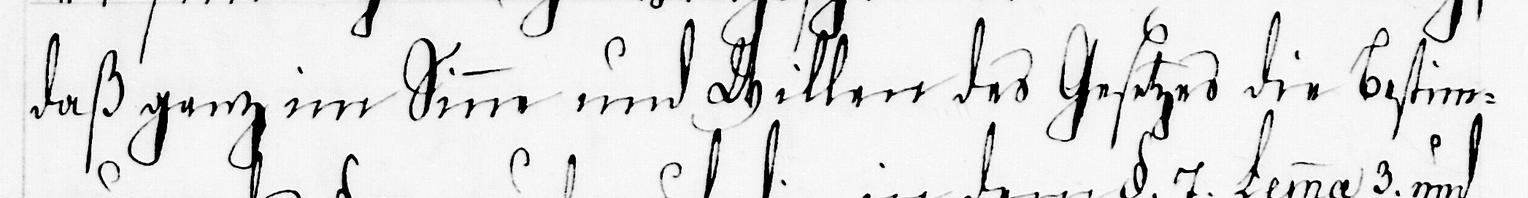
daß ganz im Sinne und Willen des Gesetzes die Bestim¬
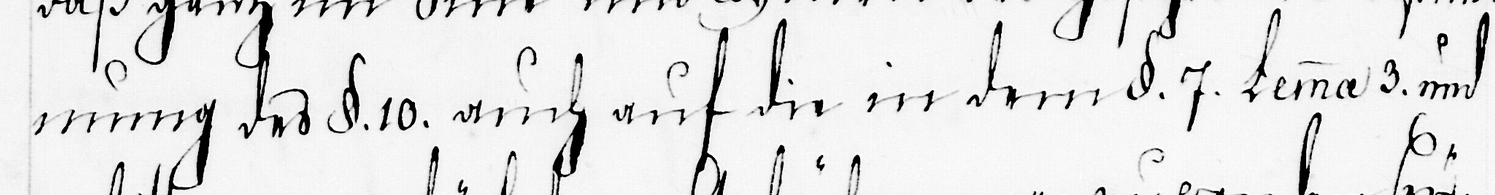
mung des §. 10. auch auf die in dem §. 7. Lemma 3. und
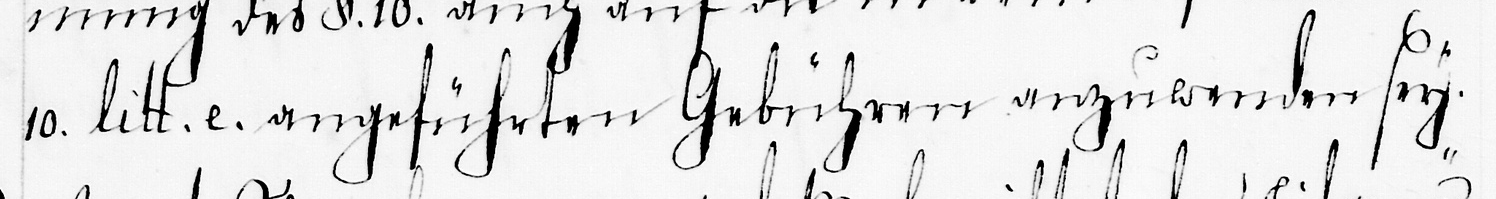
10. litt. e. angeführten Gebühren anzuwenden sey.
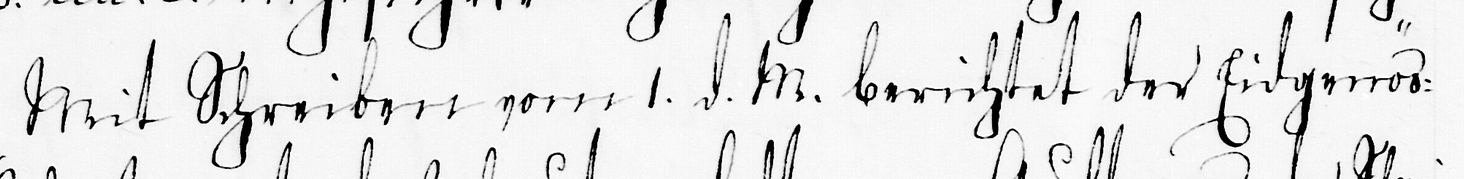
Mit Schreiben vom 1. d. M. berichtet der Eidgenöß¬
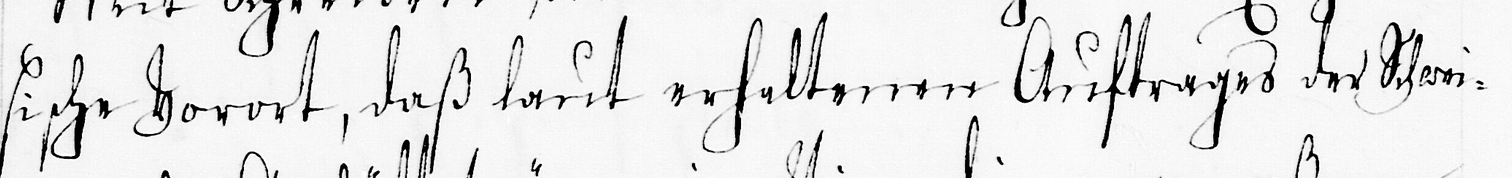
ische Vorort, daß laut erhaltenen Auftrages der Schwe¬
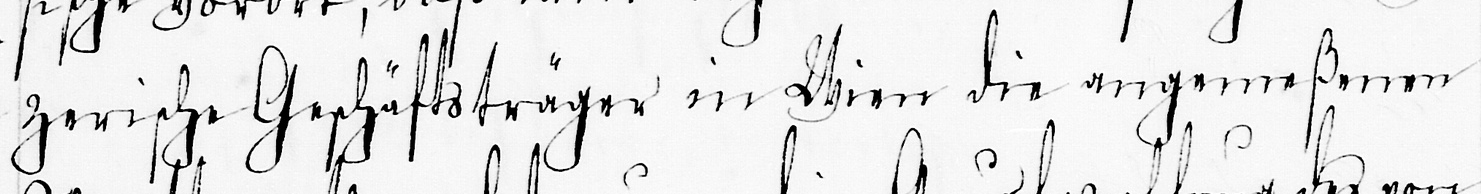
izerische Geschäftsträger in Wien die angemeßenen
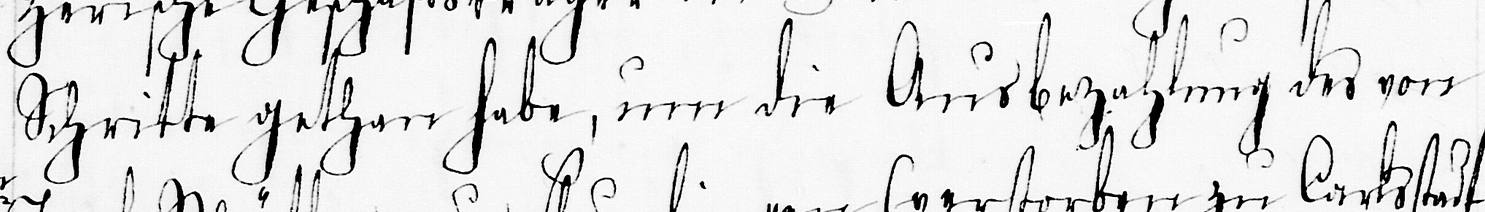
Schritte gethan habe, um die Ausbezahlung des von
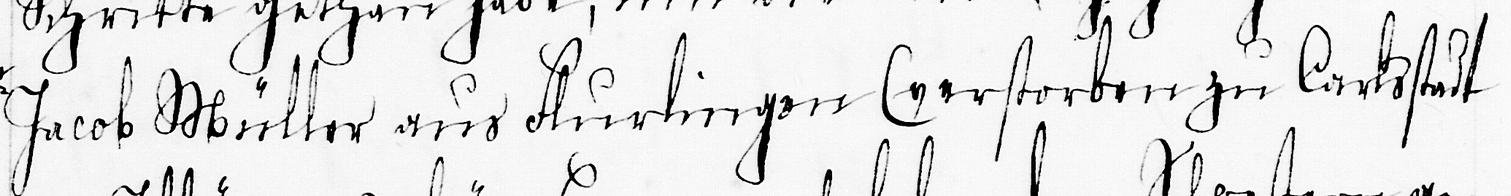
Jacob Müller aus Flurlingen (verstorben zu Carlstadt
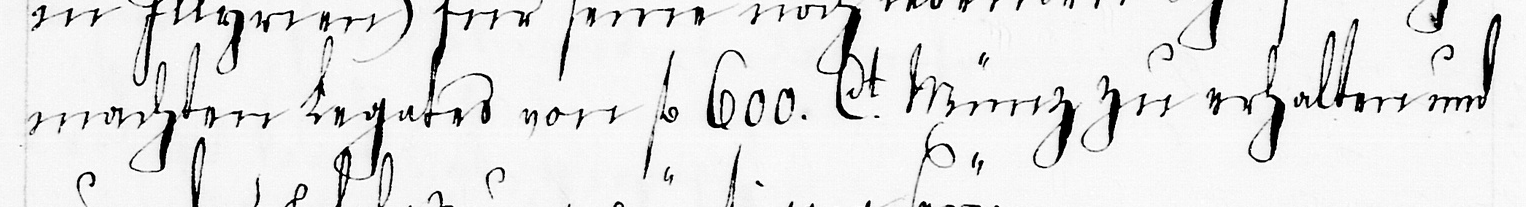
machten Legates von fl. 600. Ct. Münz zu erhalten und
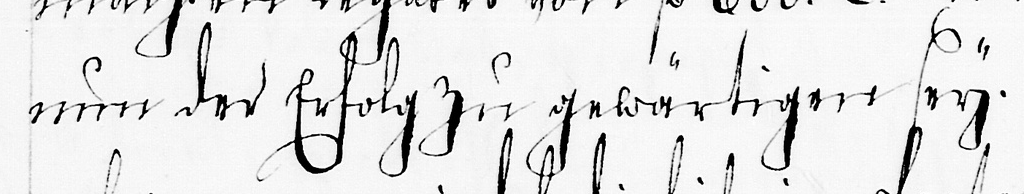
nun der Erfolg zu gewärtigen sey.
